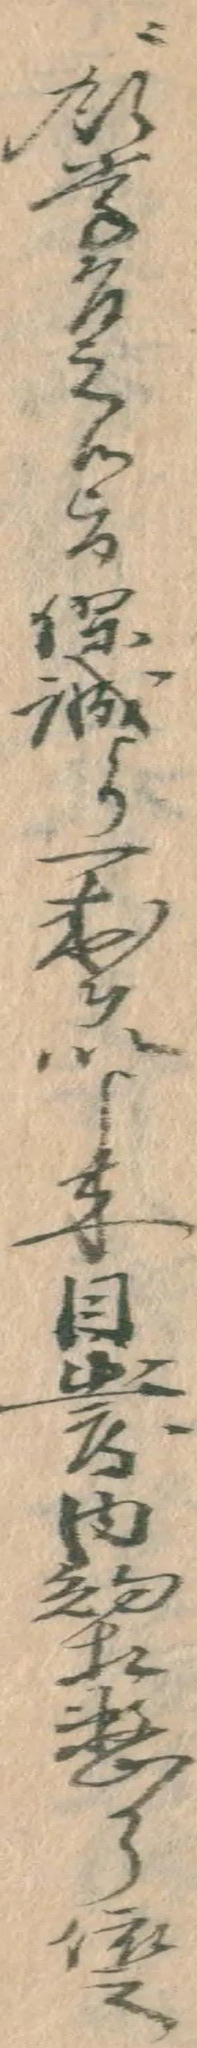ニ領掌有之候旨保誠より一本ヲ以申来目出度内約相整依之
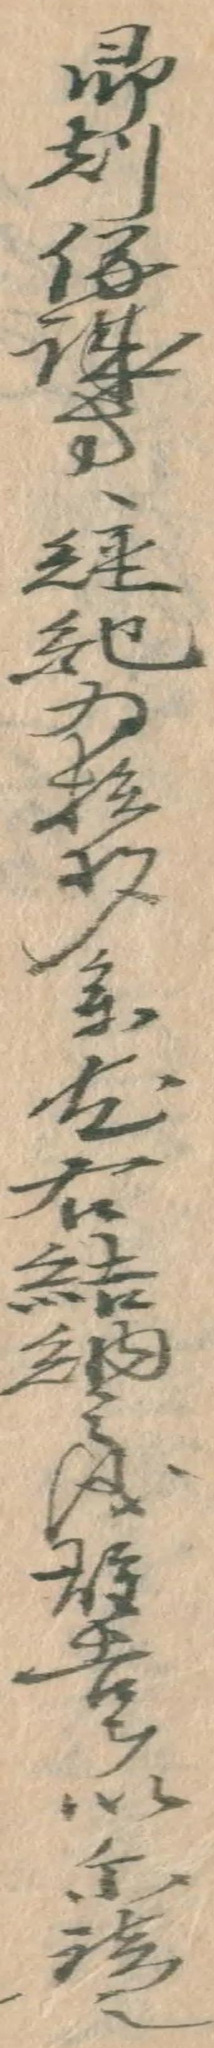即刻縁保誠方へ経紀為挨拶参尤右結納之儀雄吉ヲ以示談之
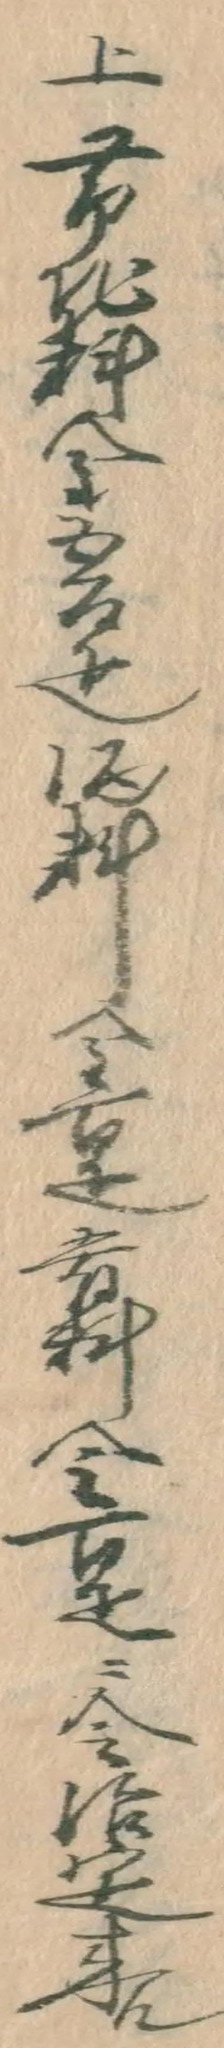上帯地料金五百疋酒料金百疋肴料金百疋ニ令治定来ル
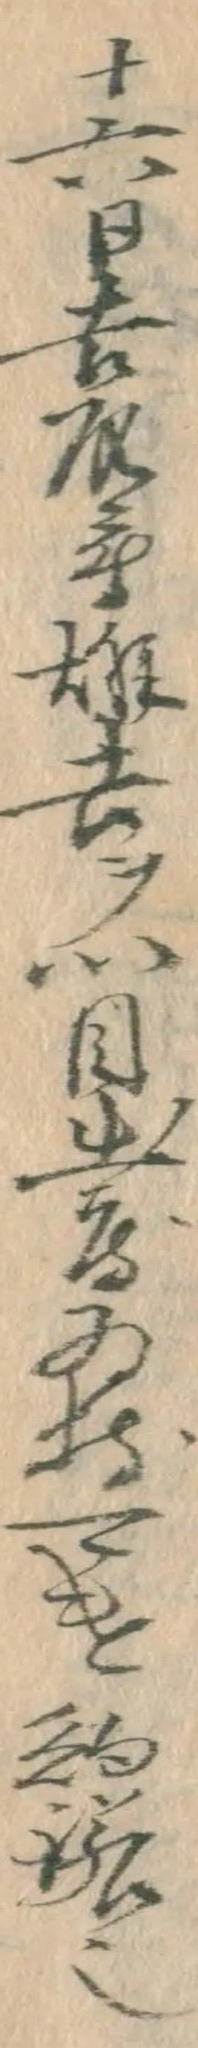十六日吉辰ニ付雄吉ヲ以目出度為持可遣約也
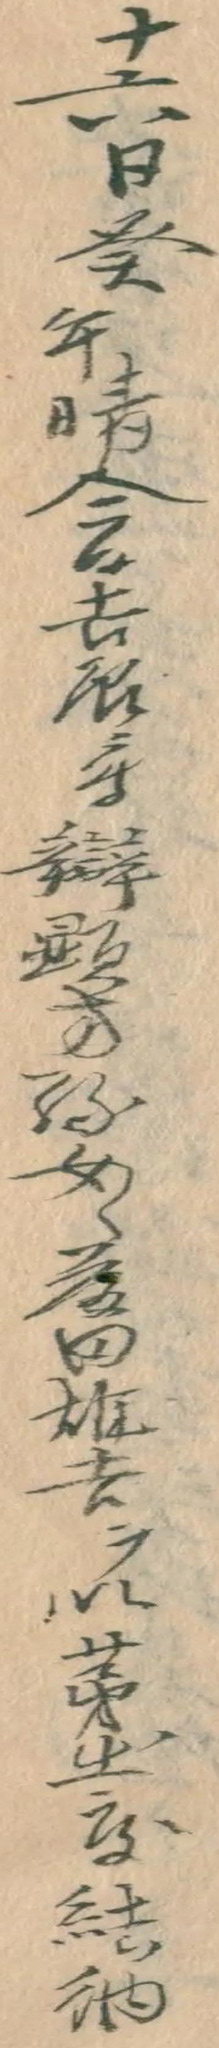十六日癸午時今日吉辰ニ付辨顕方嫁女へ藤田雄吉ヲ以茅出度結納

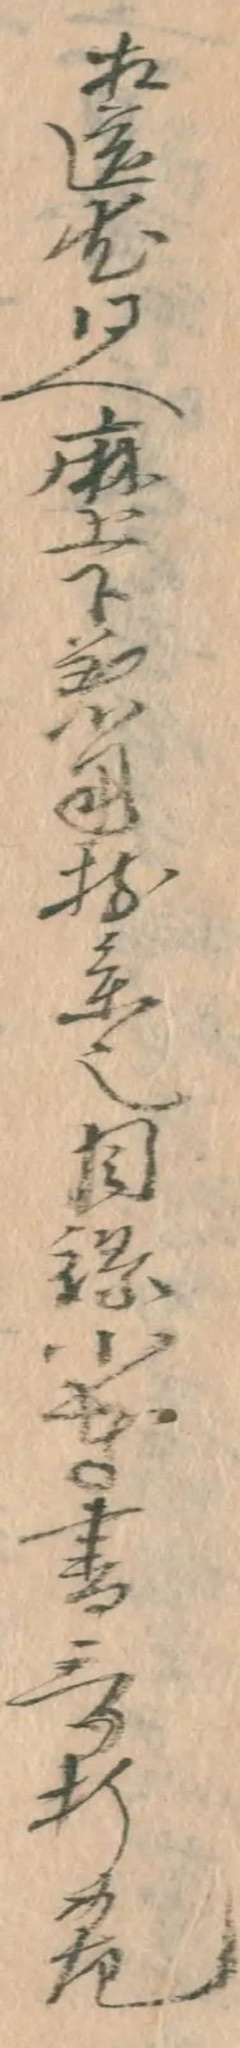相送尤同人麻上下着用持参也目録小奉書三ツ折如左
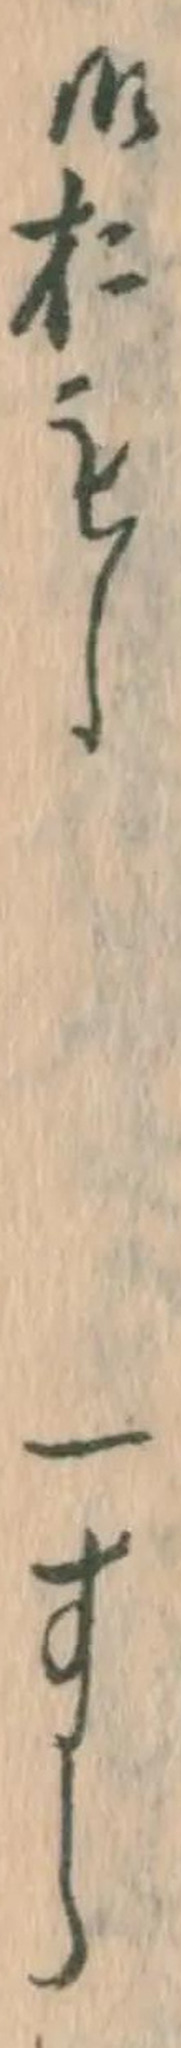御おもし一すし
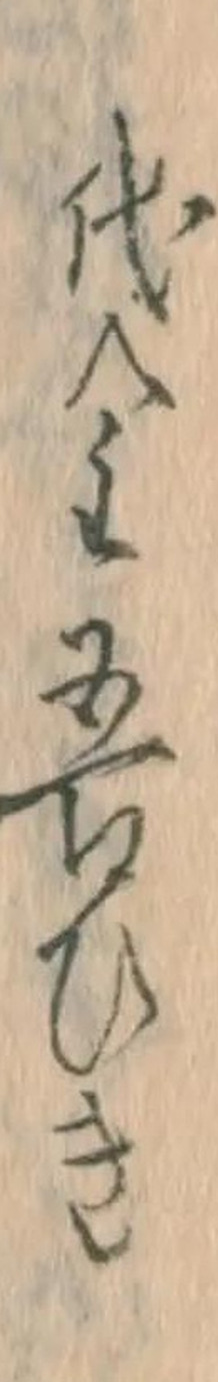代金百ひき
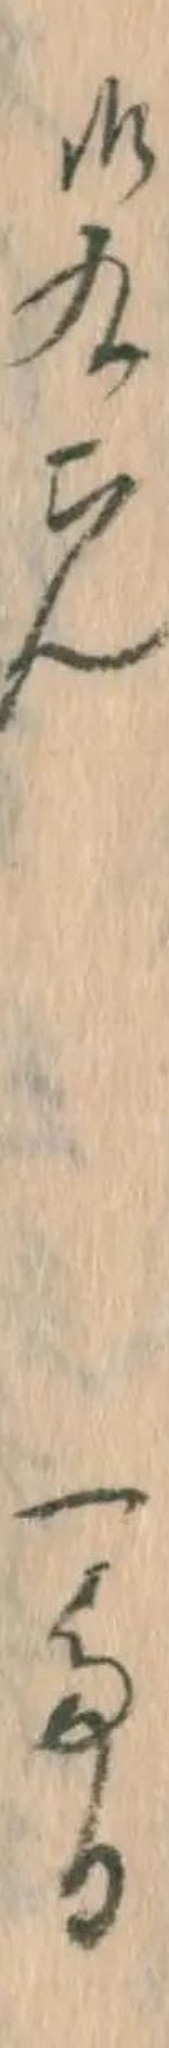御九こん一たる
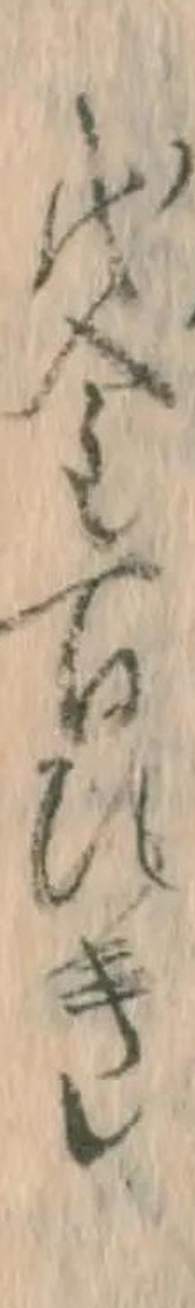代金百ひき
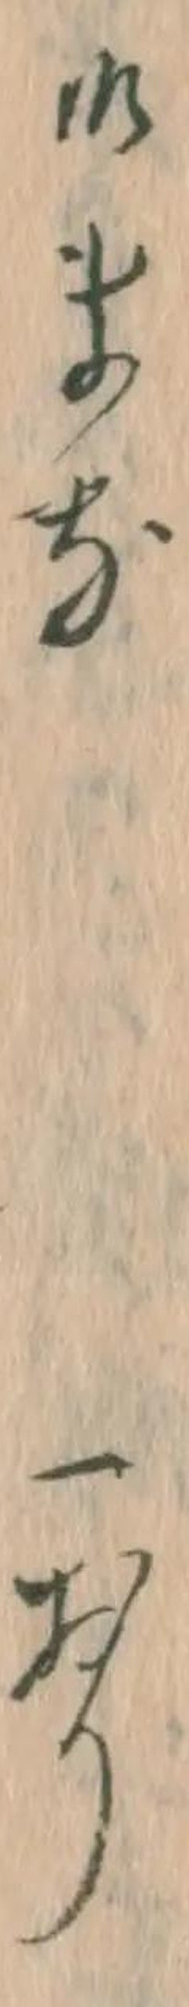御まな一おり
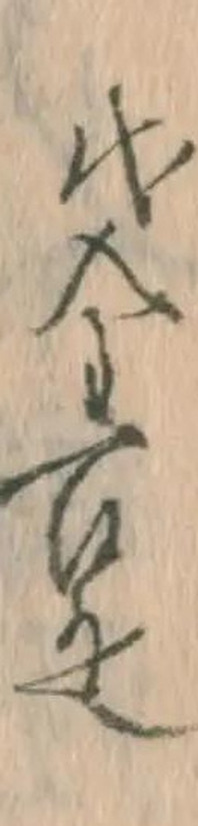代金百疋
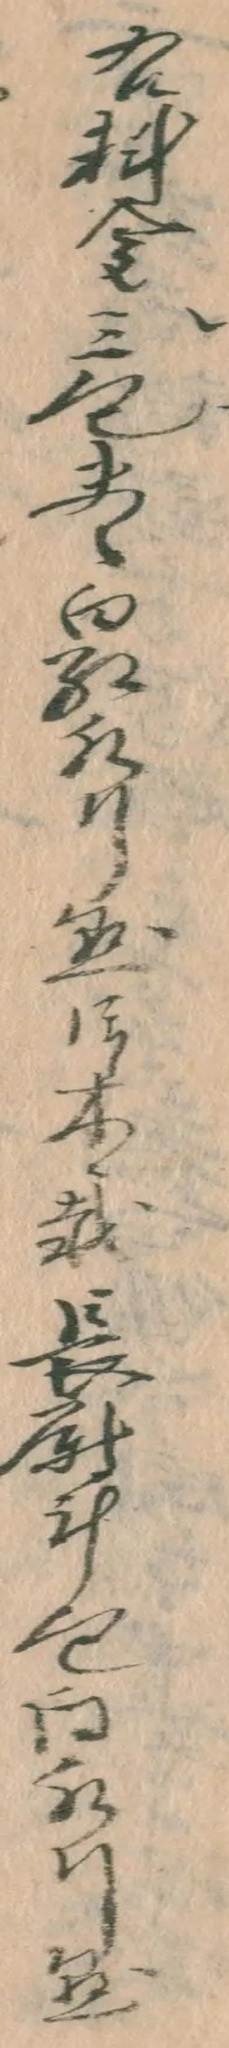右料金三包夫々白紅水引懸片木ニ載長熨斗包同水引過
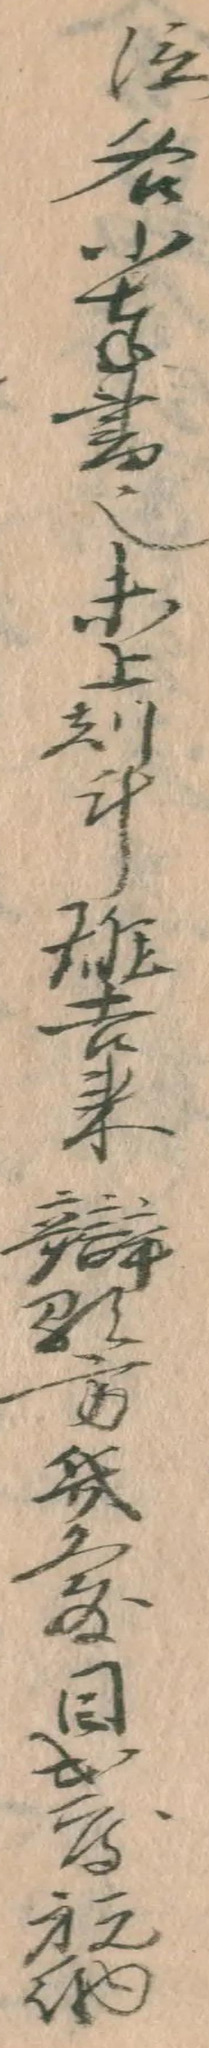談各小奉書也未上刻斗雄吉来辨顕方幾久敷目出度祝納
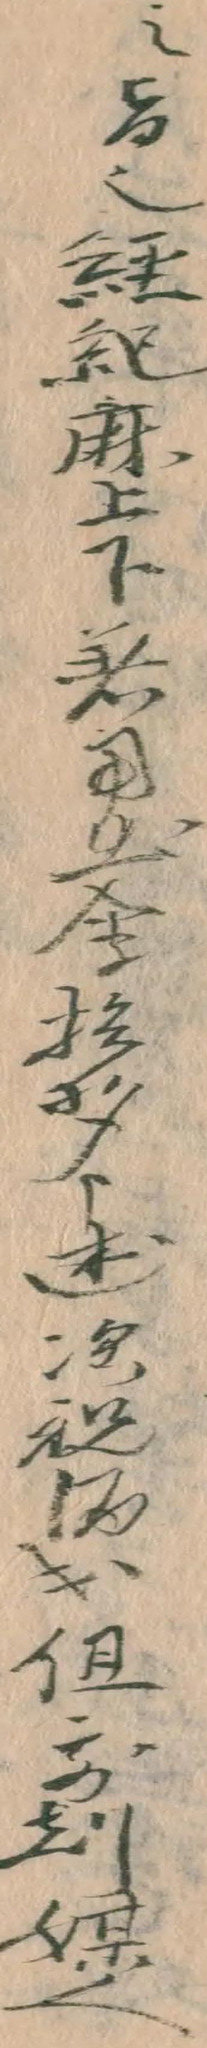之旨也経紀麻上下着用立會挨拶申述次祝酒出但前刻媒人
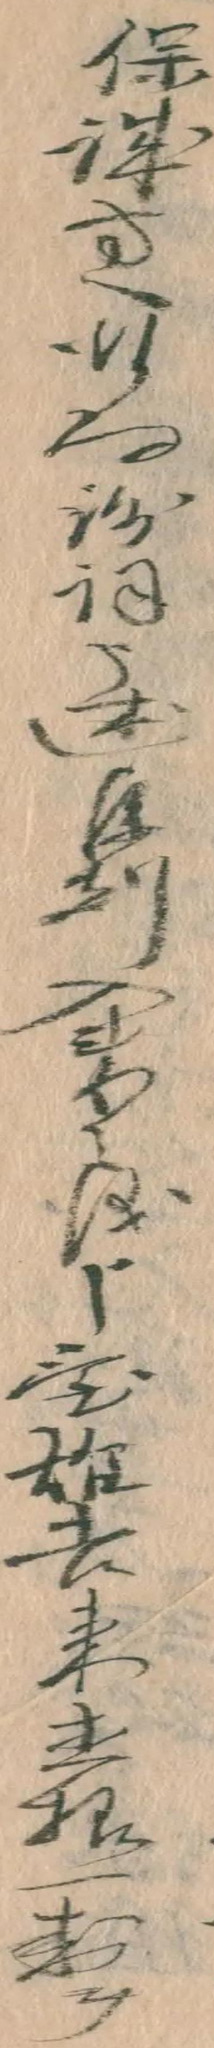保誠方へ行向詞申述後刻入来之儀申置雄吉来直様一勅ヲ
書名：賀茂社記録. 第69冊
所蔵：国立国会図書館 National Diet Library, JAPAN
